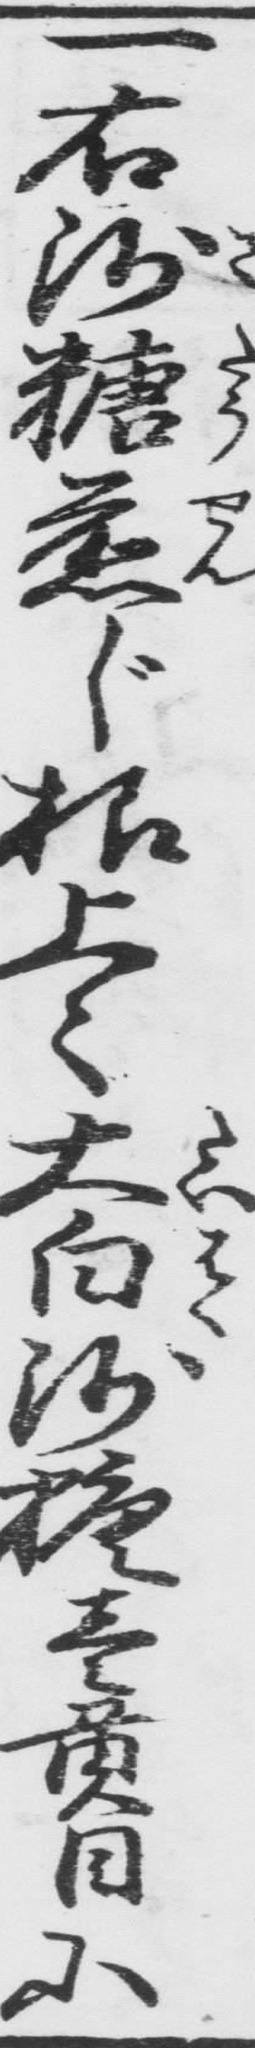一右沙糖煎じ様上々大白沙糖壱貫目に
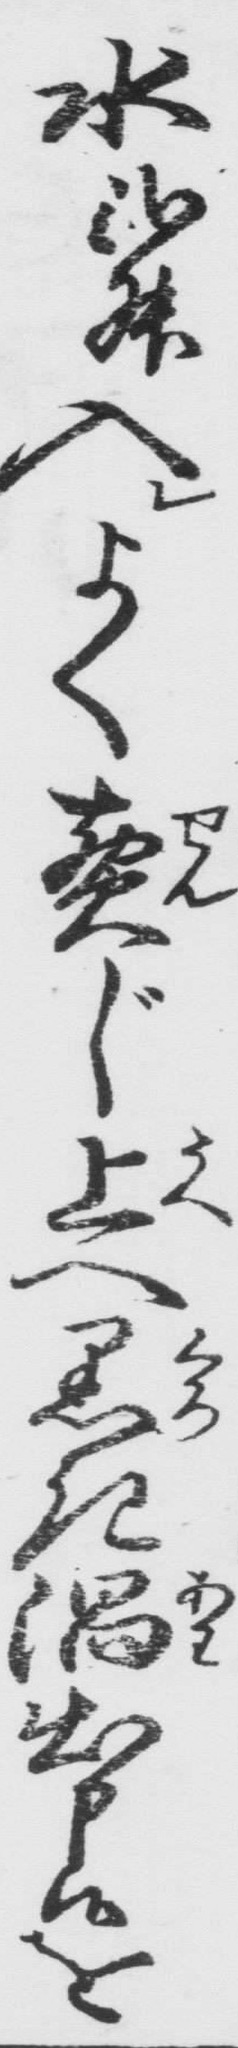水弐升入れよく煎じ上へ黒き渦出申候を
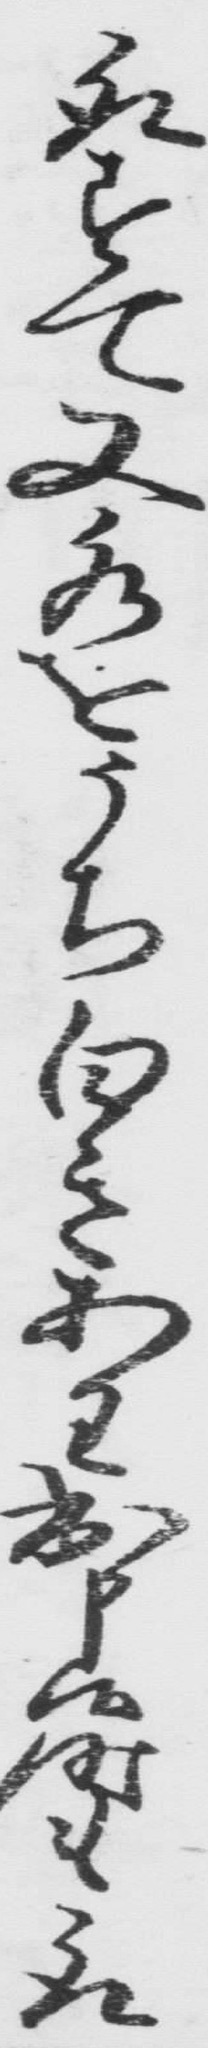取すて又水をうち白きあわ出申候時も取
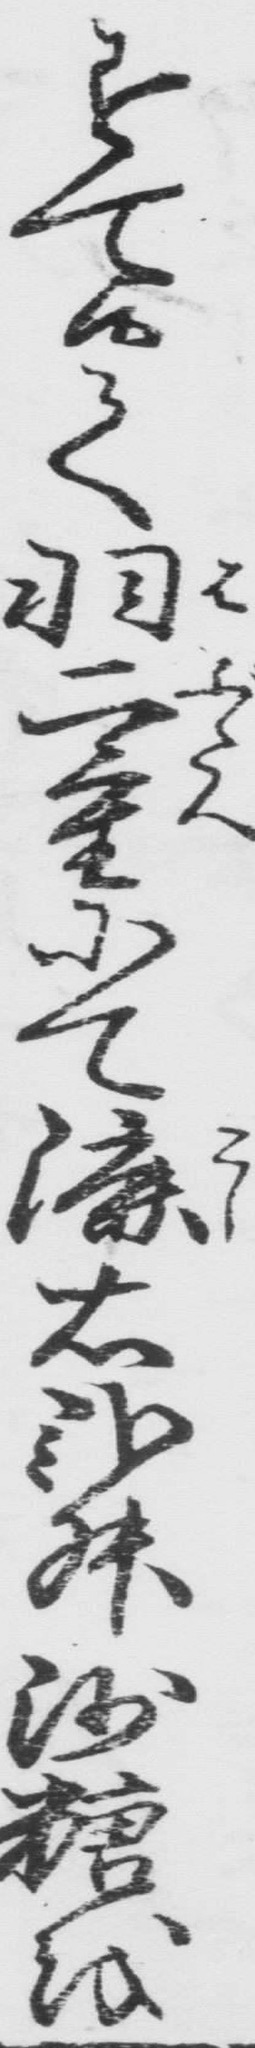すて候て羽二重にて漉右弐升沙糖を
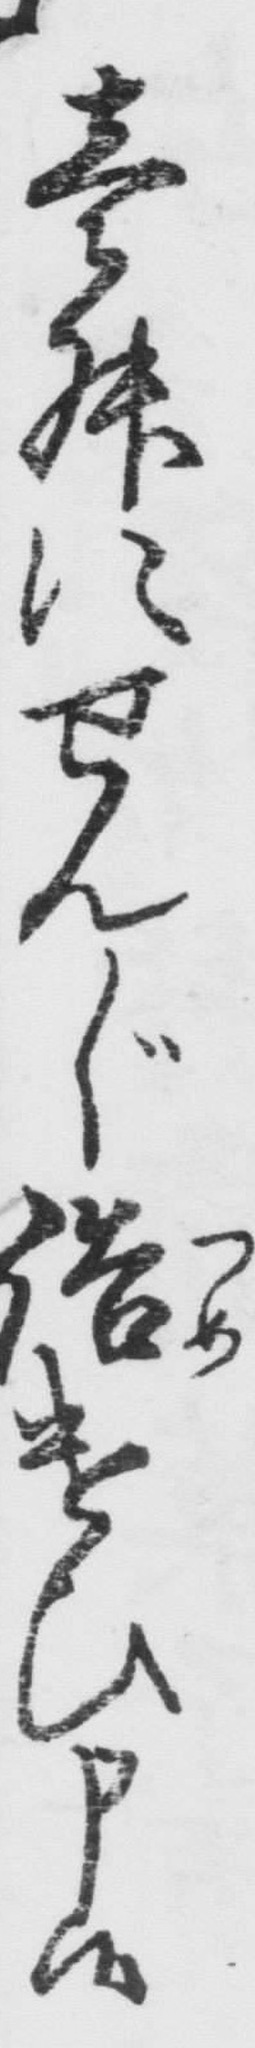壱升にせんじ詰遣ひ申候
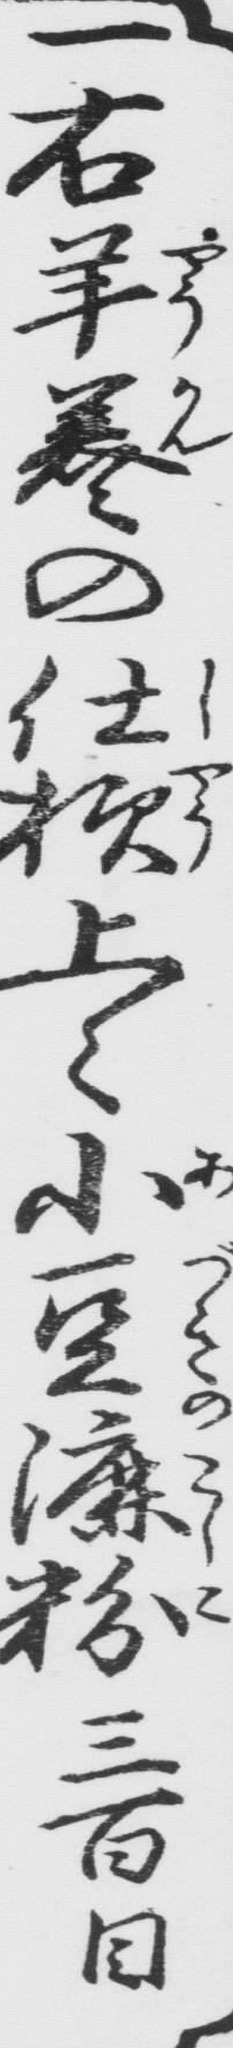一右羊羹の仕様上々小豆漉粉三百目
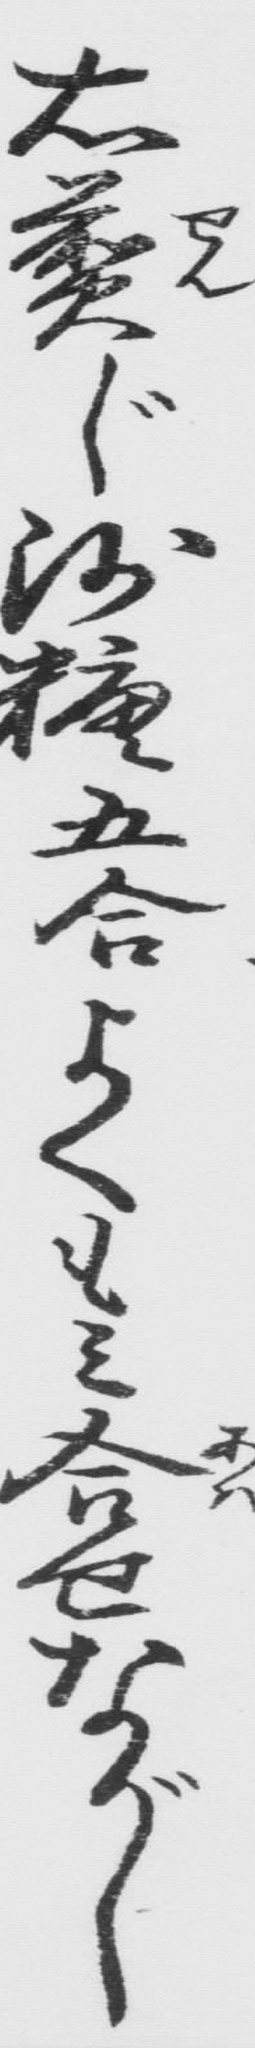右煎じ沙糖五合よくもみ合せながし
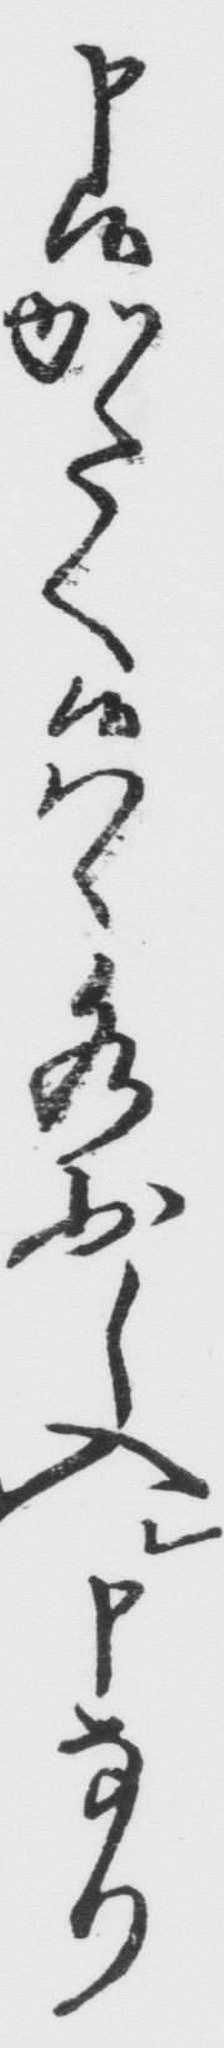申候かたく候はゝ水少し入れ申なり
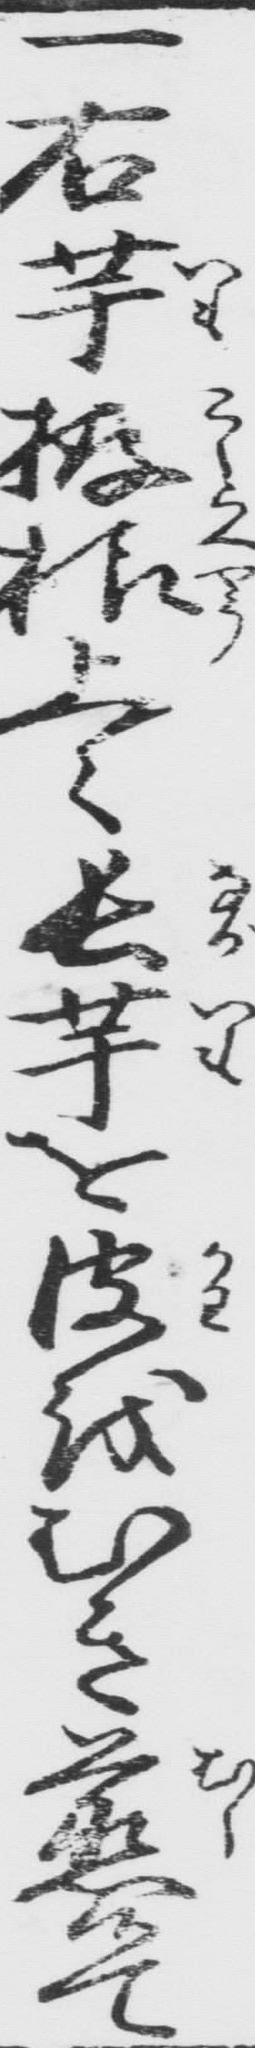一右芋拵様上々長芋を皮をむき蒸候て
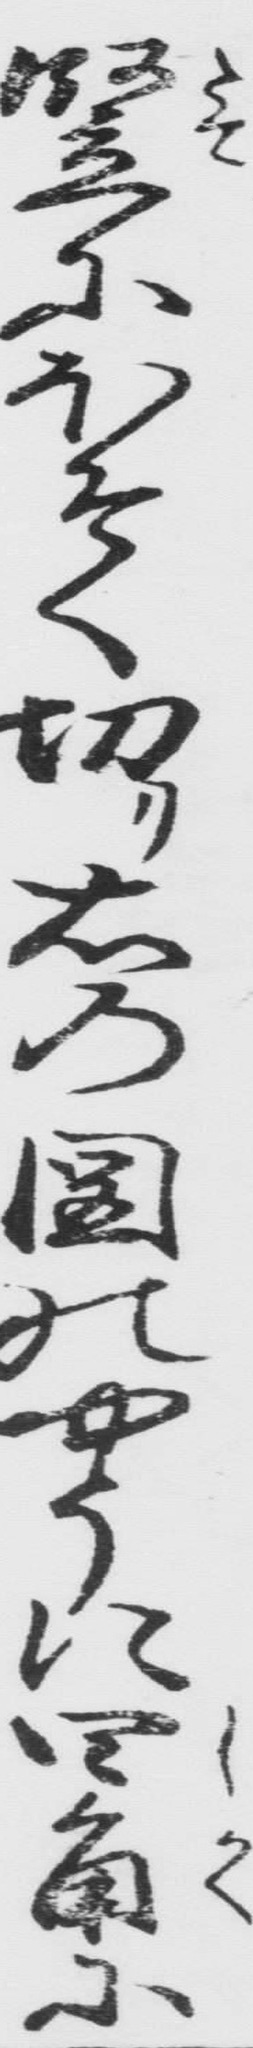竪にほそく切り右の図のやうに四角に
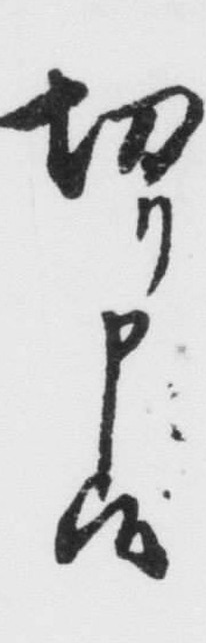切り申候
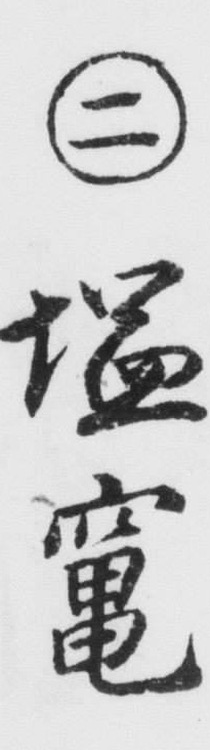(二)塩竈

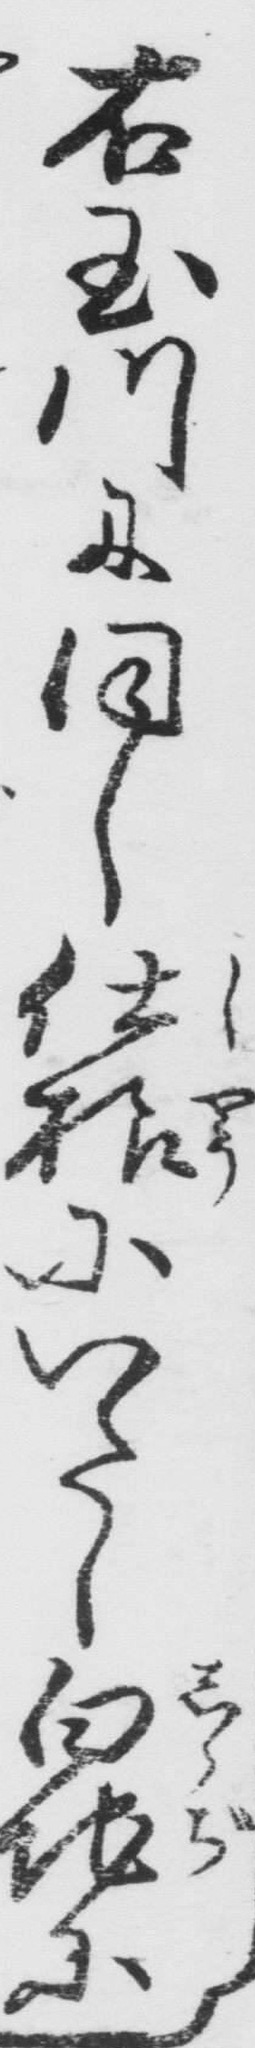右玉川に同し仕様にいたし白地に
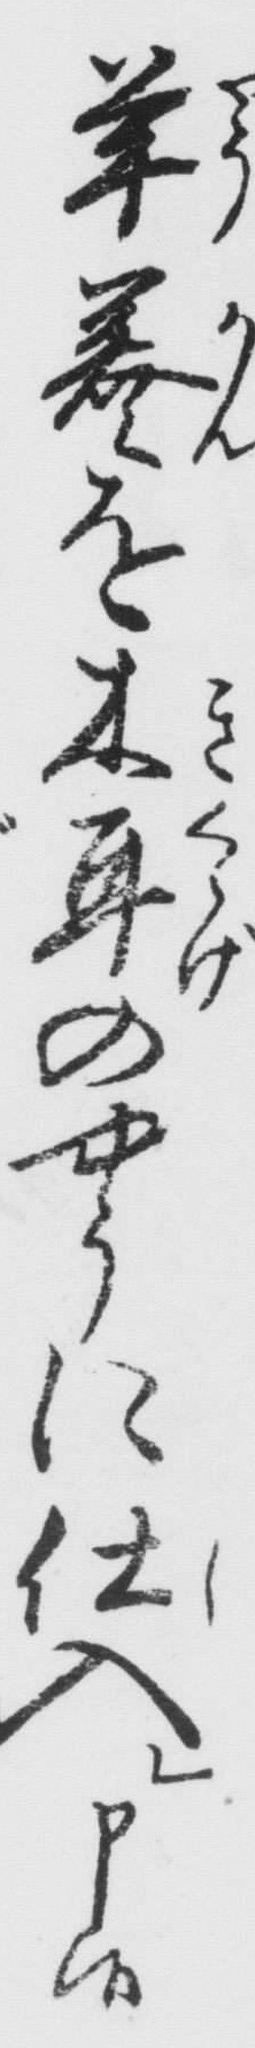羊羹を木耳のやうに仕入れ申候
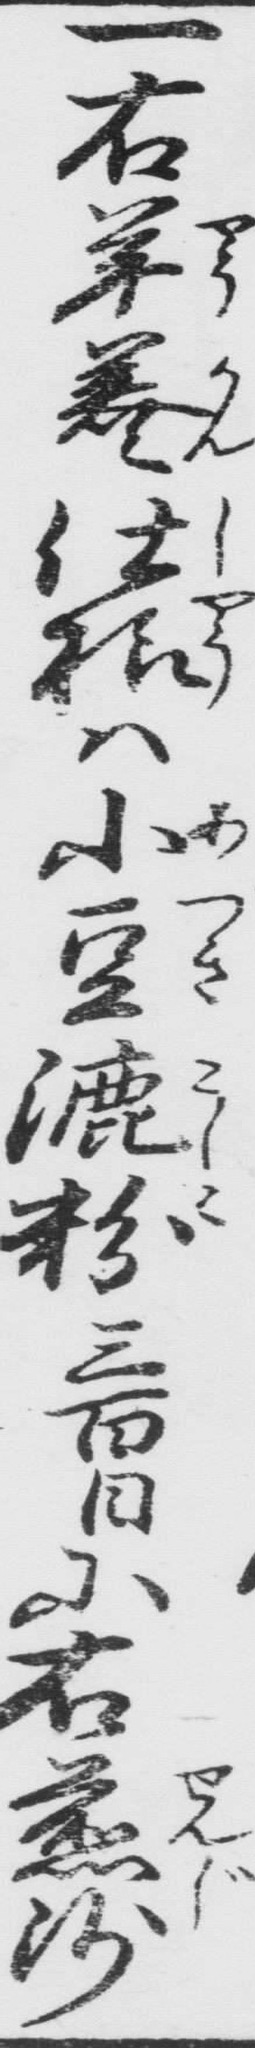一右羊羹仕様は小豆漉粉三百目に右煎沙
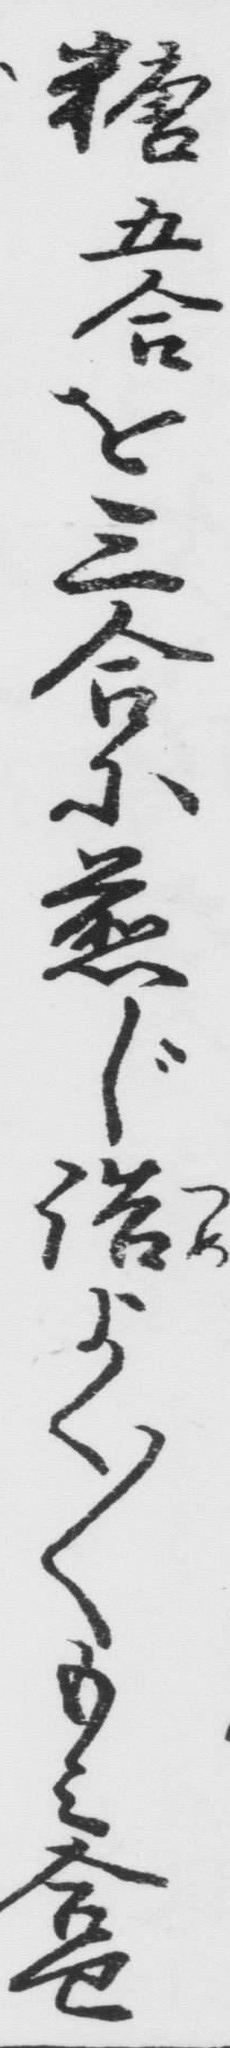糖五合を三合に煎じ詰よく〳〵もみ合せ
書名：御前菓子図式
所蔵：大阪府立大学学術情報センター 国文学研究資料館
